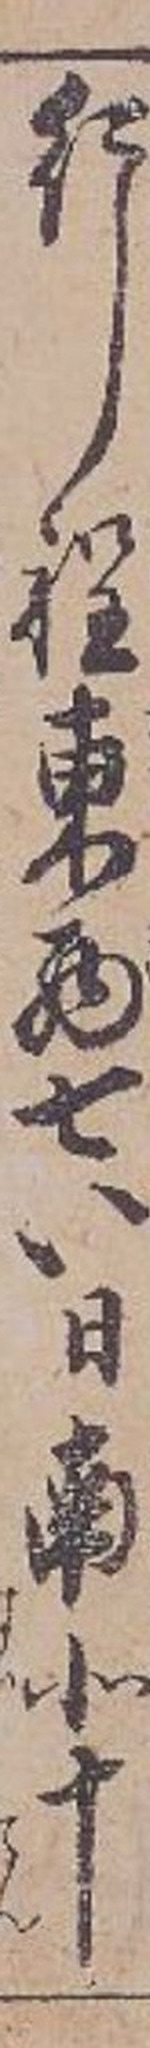行程東西七八日南北十
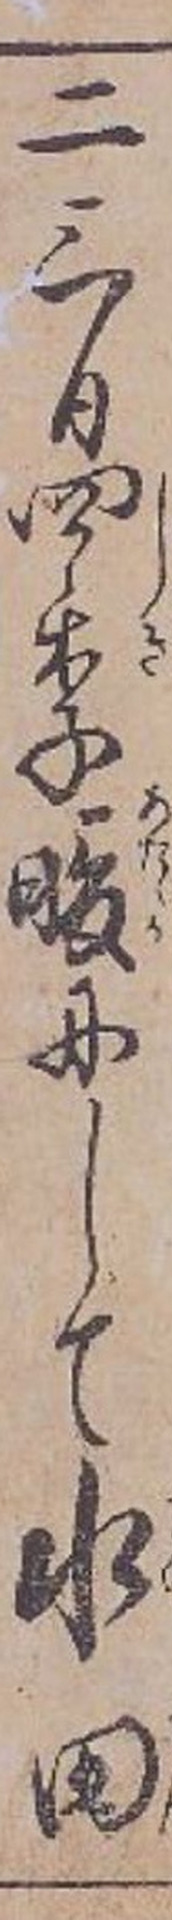二三日四季暖にして水田

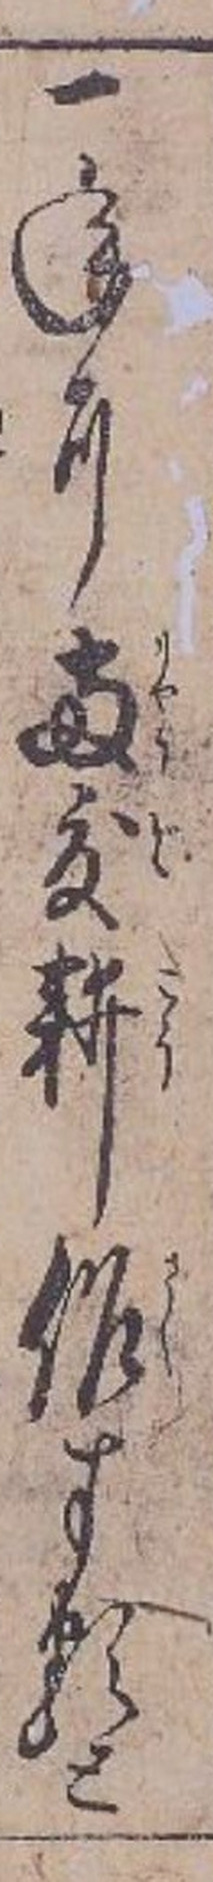一年可両度耕作すると
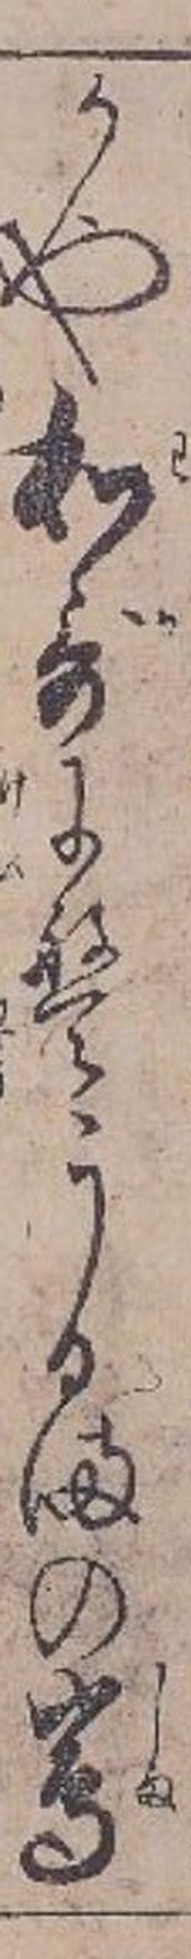かや和哥にはうるまの嶋
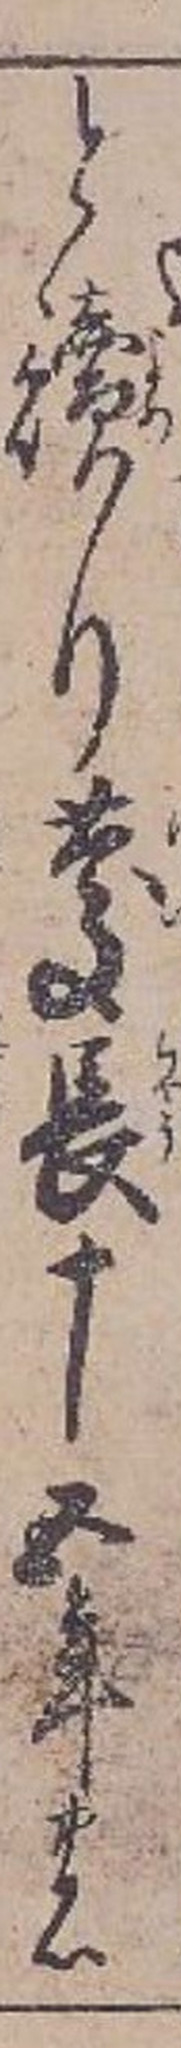と讀り慶長十五年の
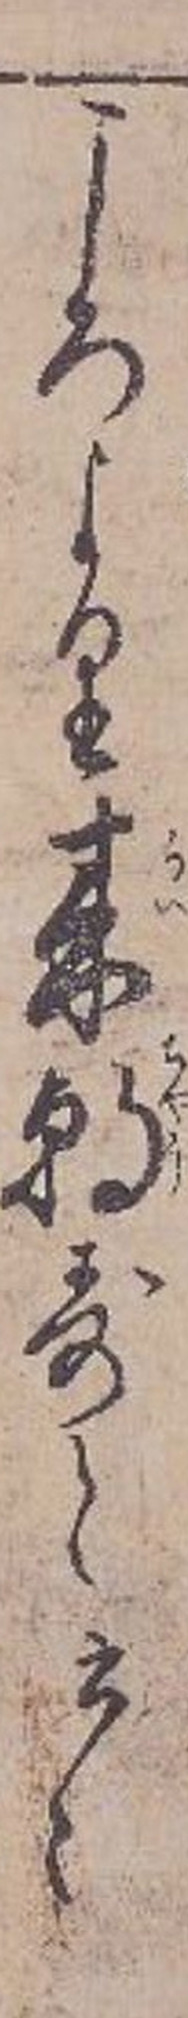ころより来朝すと云々
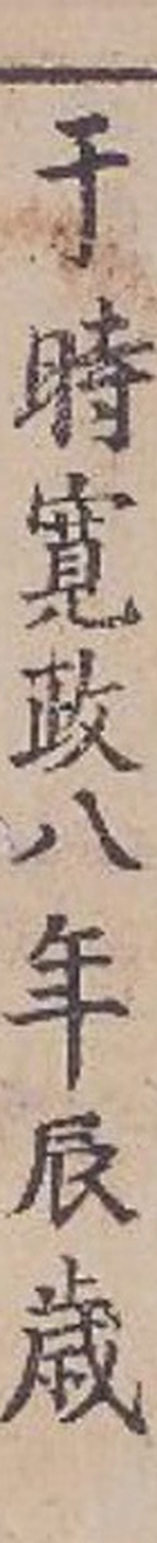干時寛政八年辰歳
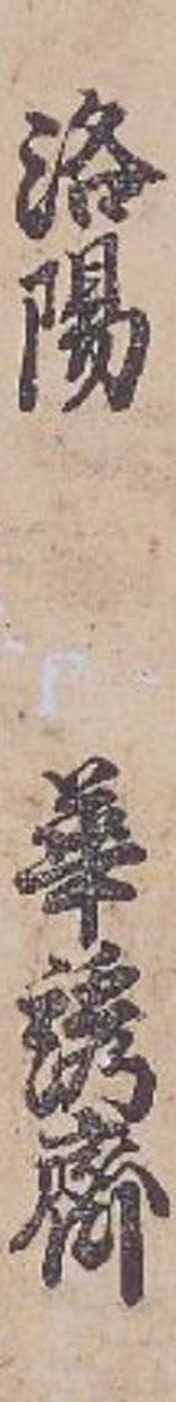洛陽華誘齊
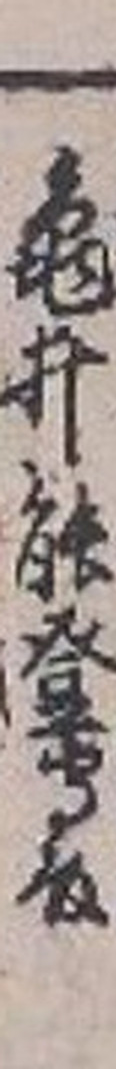亀井能登守殿
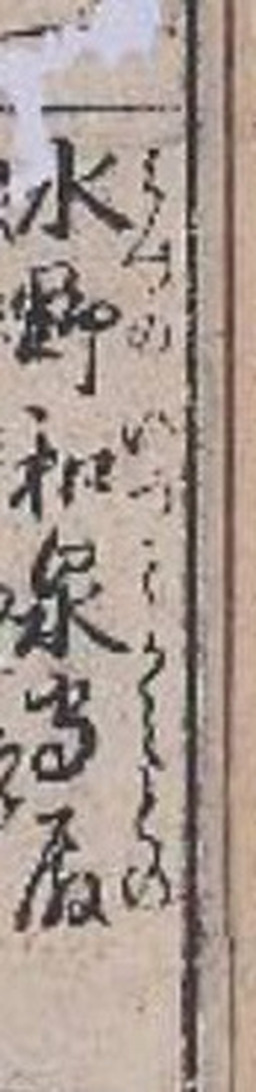水野和泉守殿
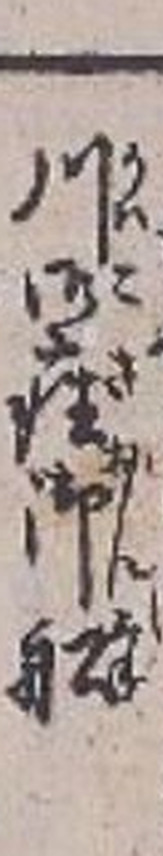川御座御船
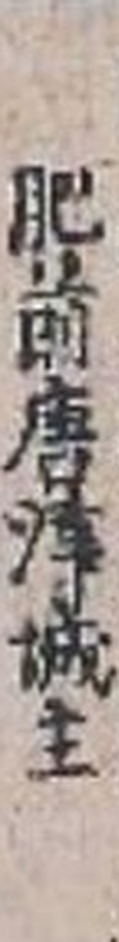肥前唐津城主
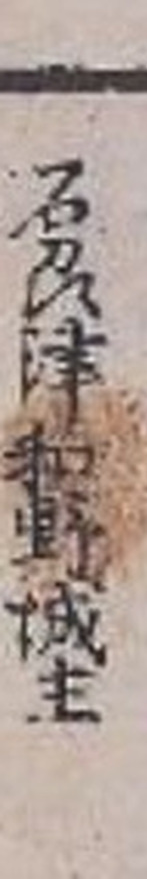石見津和野城主
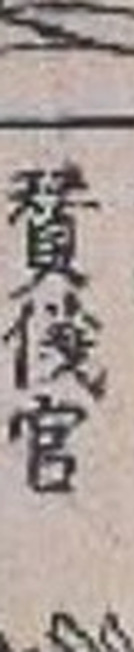賛議官
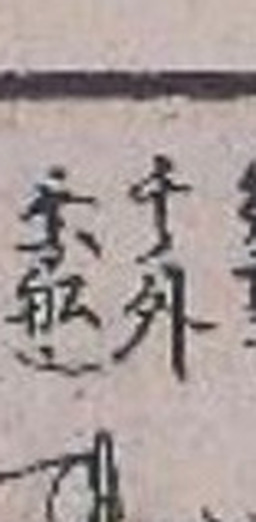乗舩也
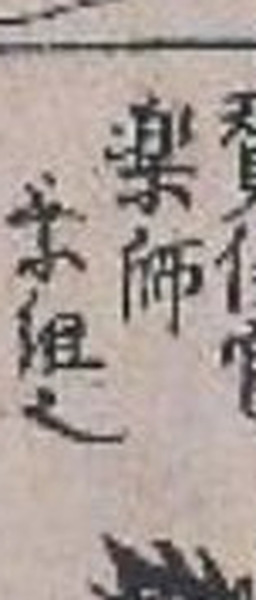乗組也
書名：琉球人大行列記 来朝新板絵入
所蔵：University of the Ryukyus Library
